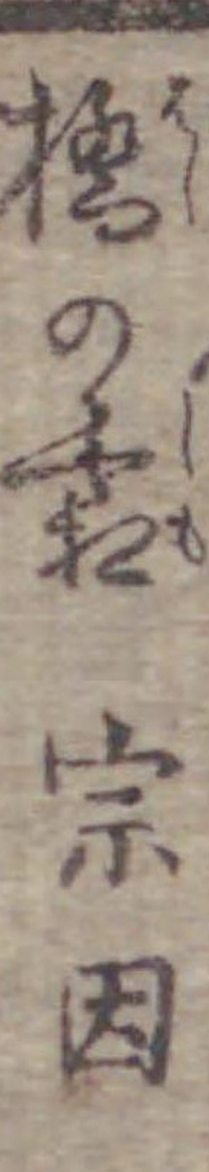橋の霜宗因
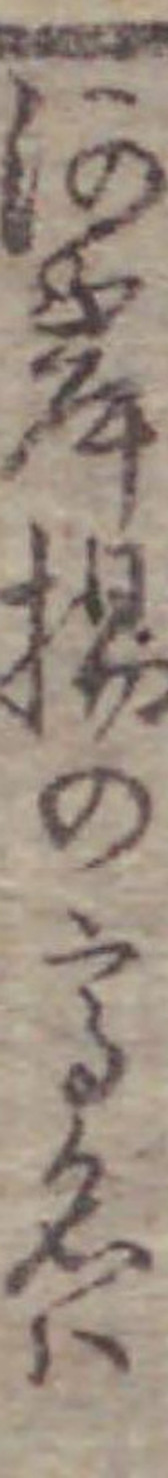河岸揚の高名は
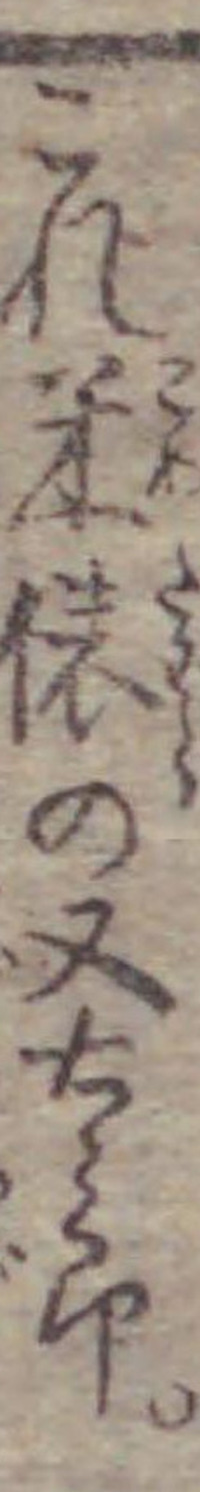これ米俵の又太郎。
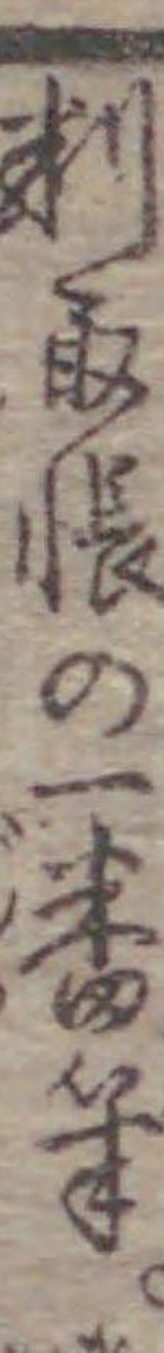判取帳の一番筆。

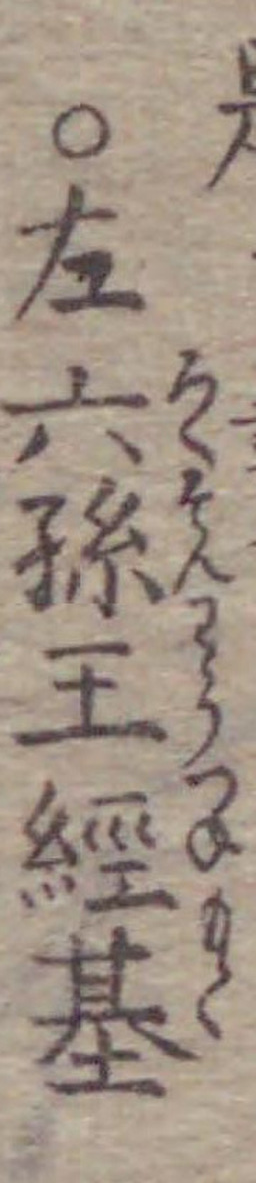○左六孫王経基
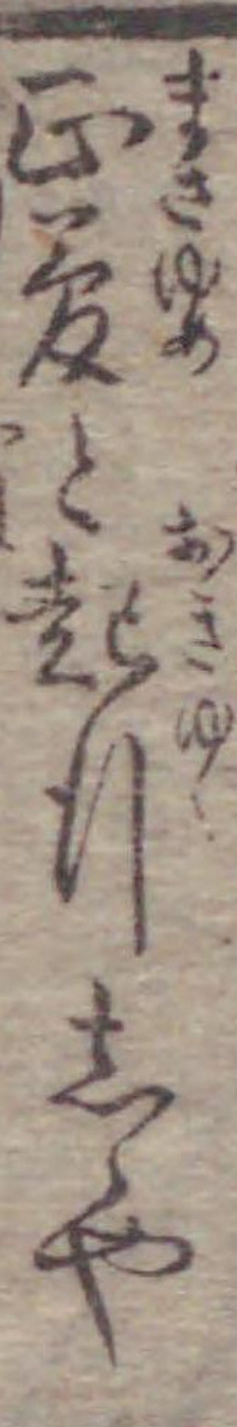正夢と起行しゝや
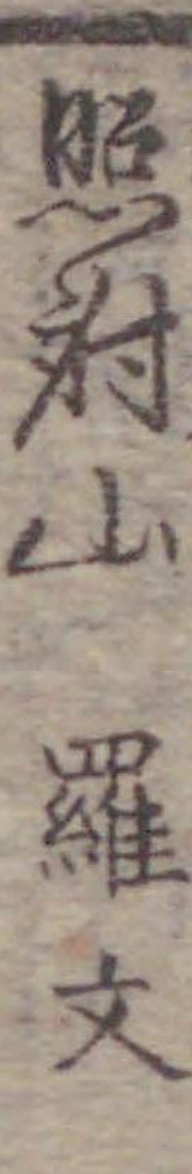照射山羅文
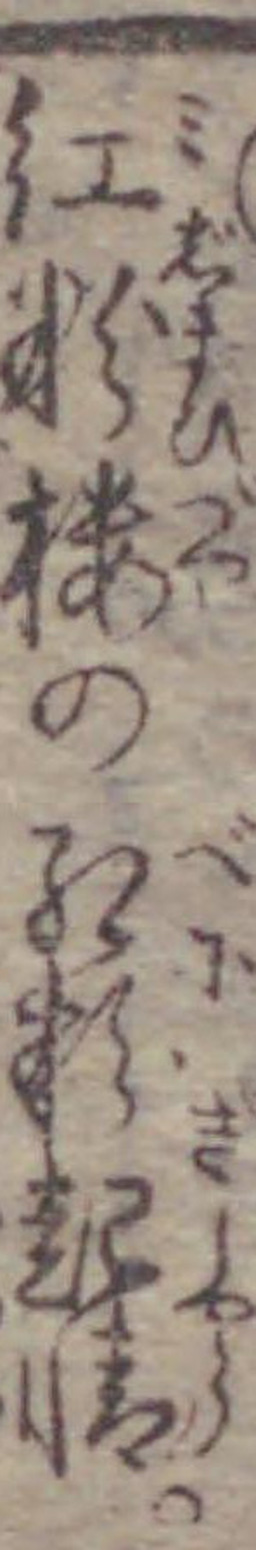紅粉楼の紅粉起請。
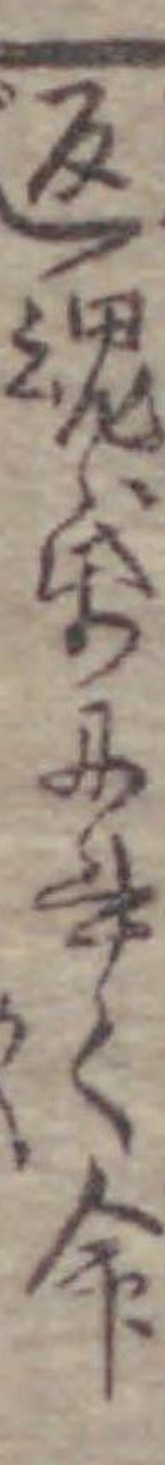反魂紙に書く命
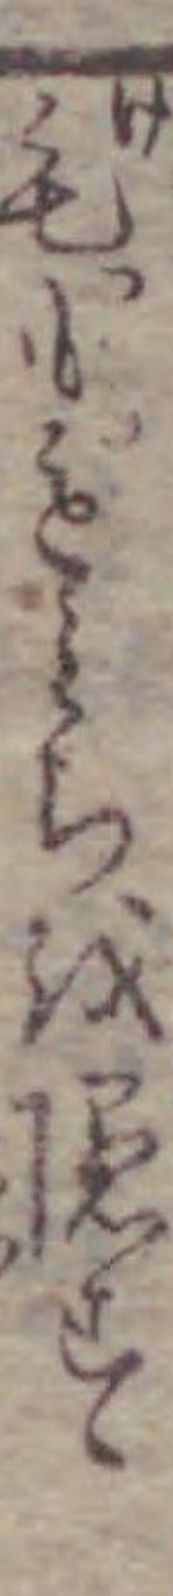毛も近みちを隠す
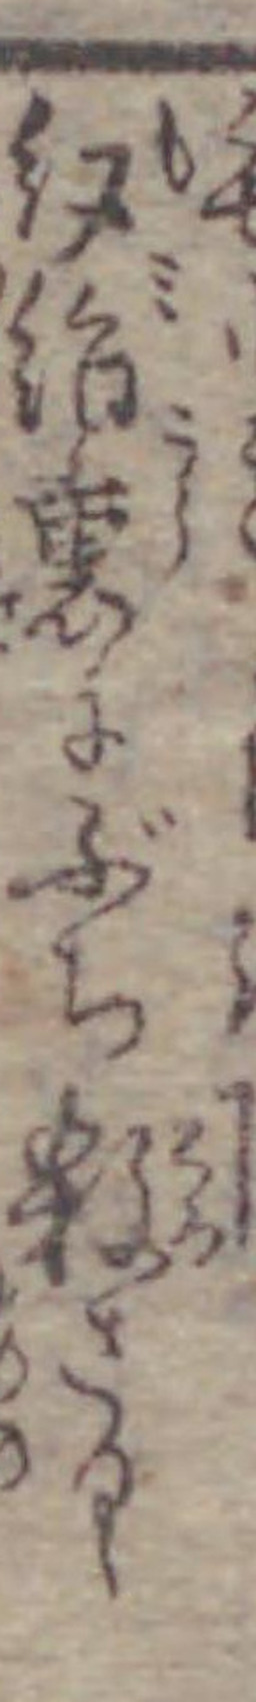紅絹裏にぶち殺さるゝ
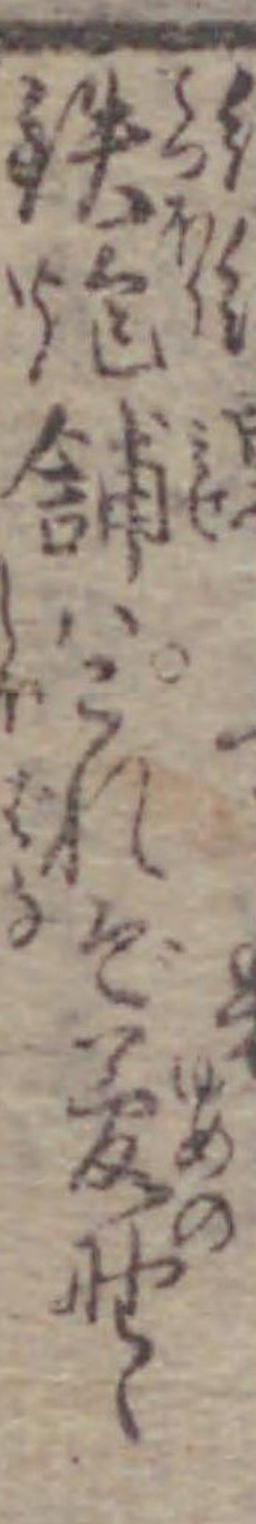鉄砲舖は。これぞ夢野ゝ
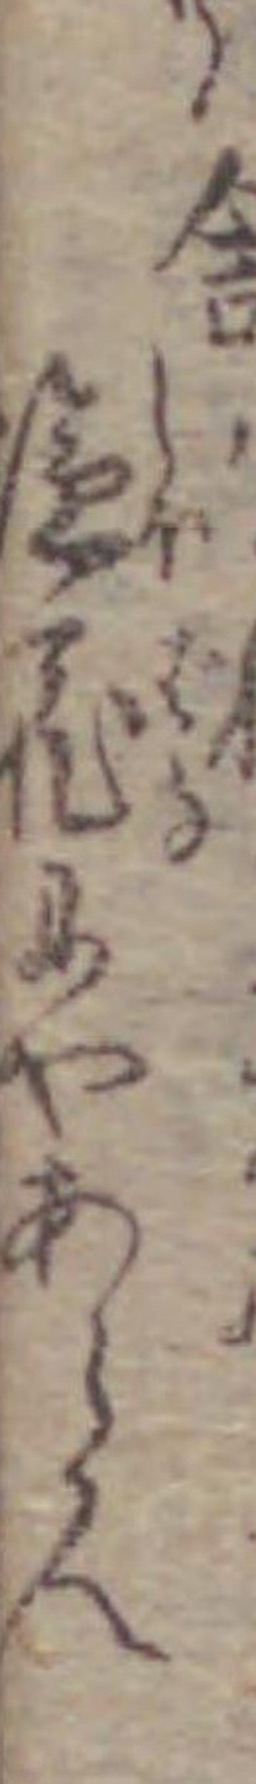塩花にやあらん
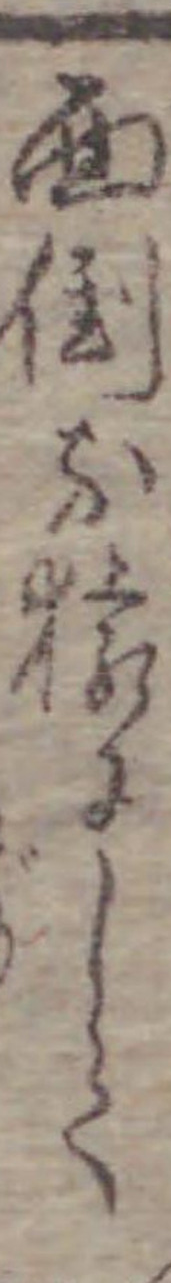面倒な猿にして
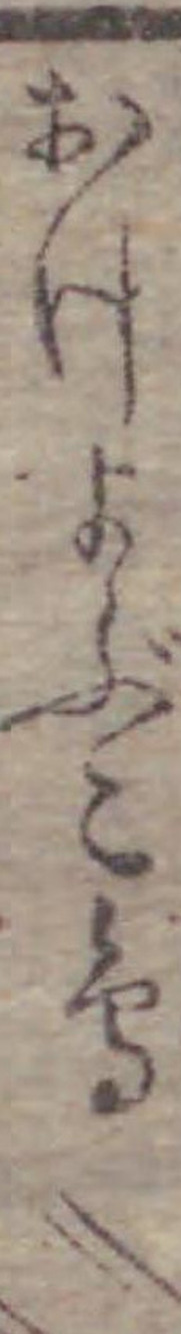おけよぶこ鳥
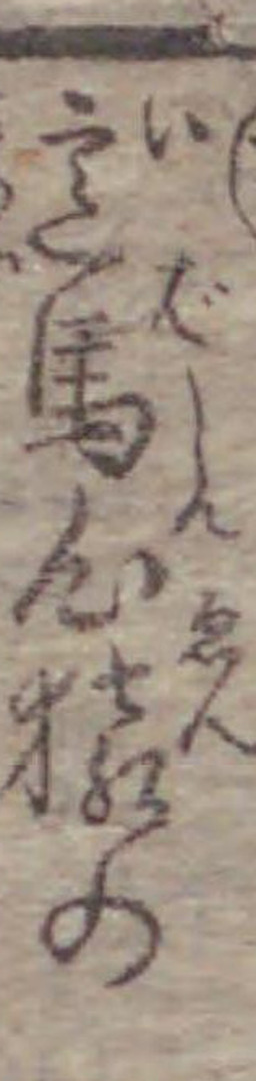意馬心猿の
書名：武者合天狗俳諧 : 2巻
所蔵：国立国会図書館 National Diet Library, JAPAN
